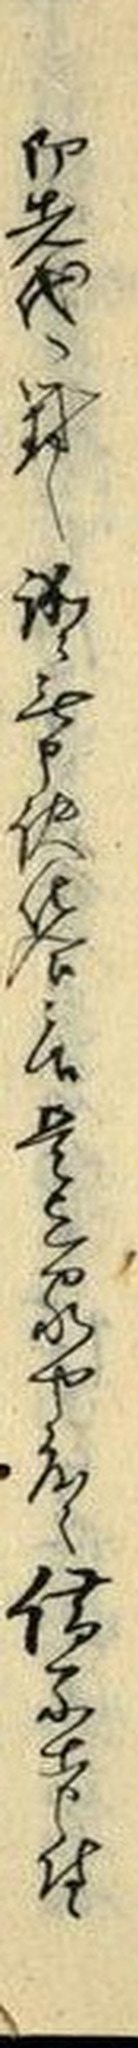御先代へ対し誠ニ無申訳仕合ニ候是迄家中ニ度々借米等申付候
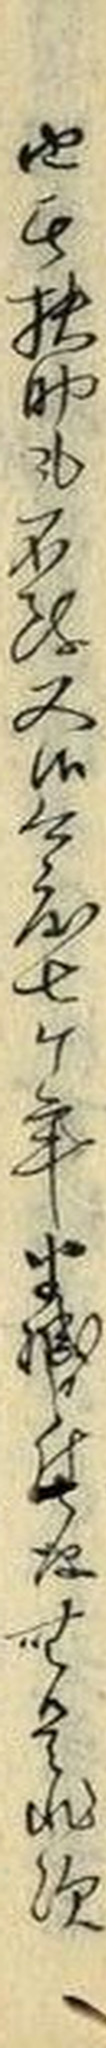由其扶助不致又候今度七ヶ年半減申付候儀無是非次
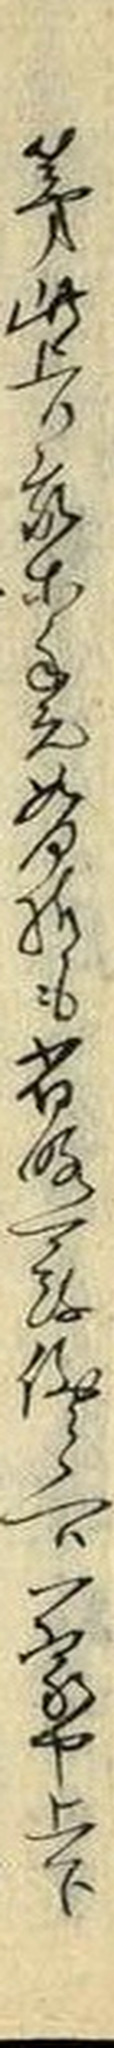第此上ハ我等手元如何様も省略可致儀ニ候へハ一家中上下
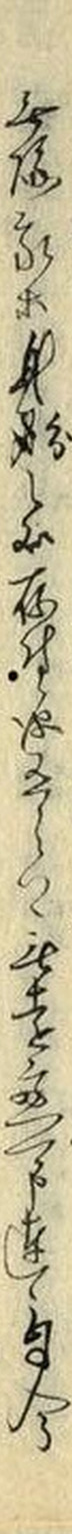無隔我等身分之処存付候儀有之候ハゝ無遠慮可申達候自今
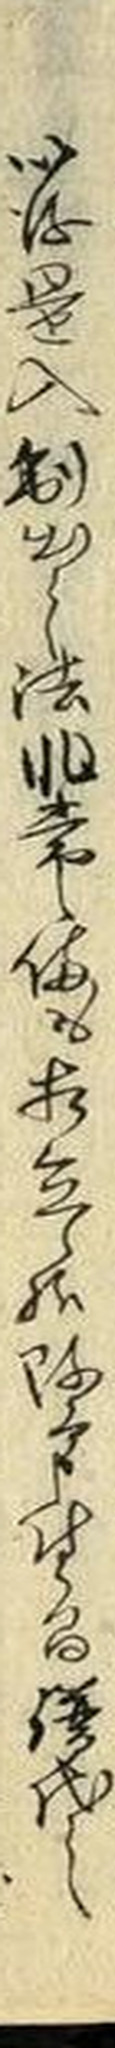以後量入制出之法非常之備も相立候様改而申付候間譜代之
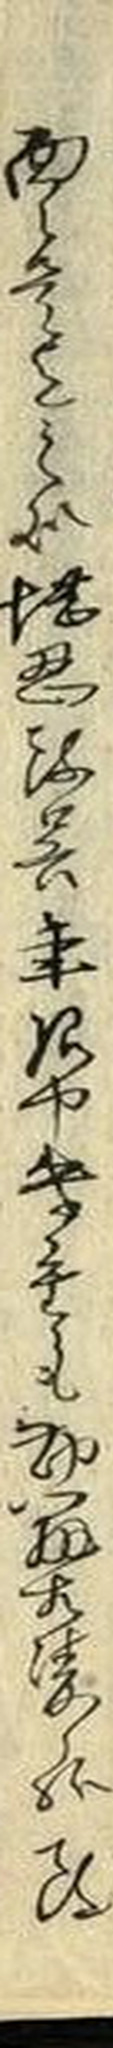面々是迄之処堪忍致呉年限中苦重も勘弁相凌候様致
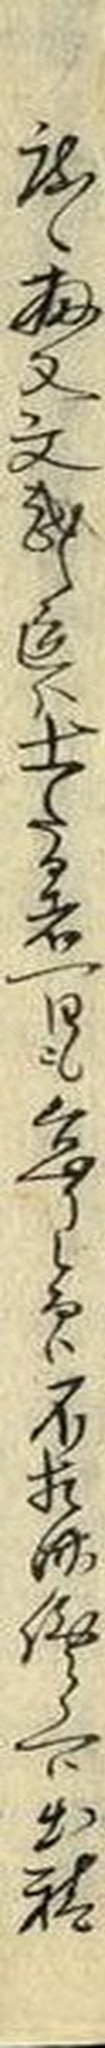度候扨又文武之道ハ士たる者一日も怠り候而ハ不相済儀ニ候へハ出精
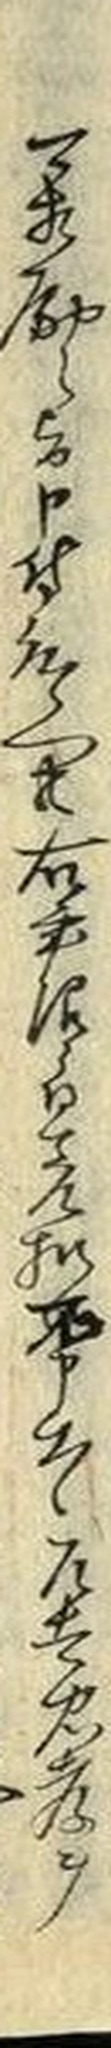可相励候旨申付度候へ共右年限ニ付差扣不申出候乍去忠孝ヲ
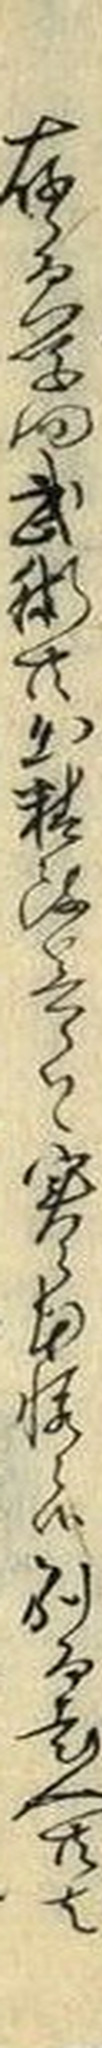存候而ハ学問武術共出精致呉候ハゝ実ニ本懐ニ候別而老人共は
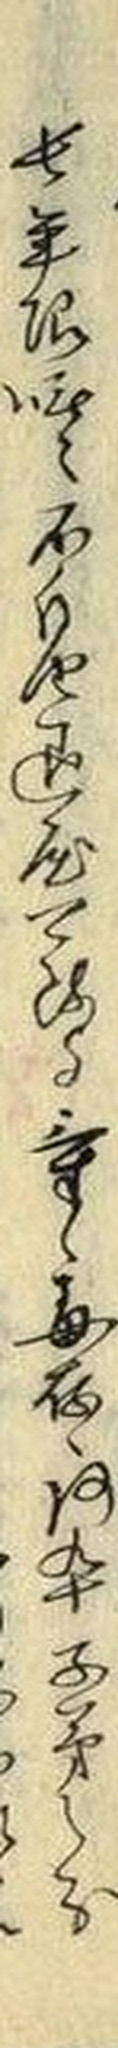長年限嘸々不自由退屈可致与気之毒存候何卒子弟之分
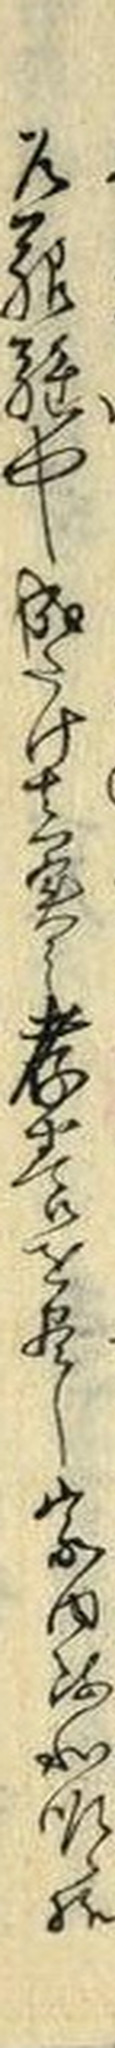乍艱難中成たけ真実之孝養を尽し家内致和順候様
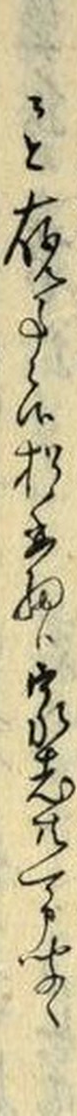ニと存候事ニ候猶委細ハ家老共可申聞候
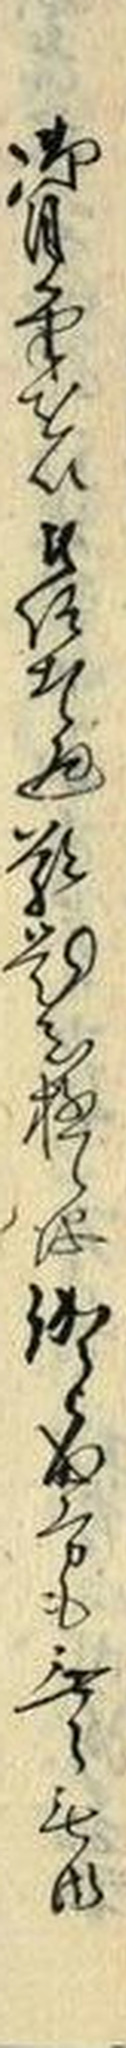御自筆を以被仰出候通難題至極之儀誠ニ被成方も無之無御拠
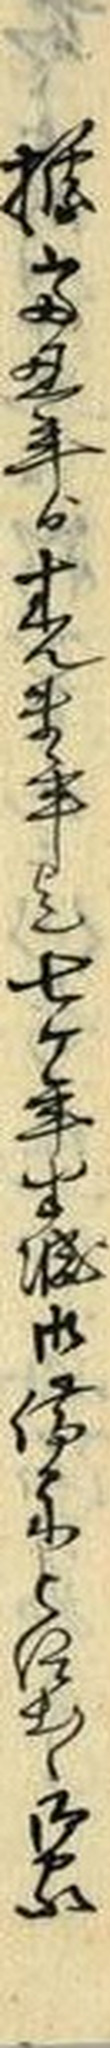拠当丑年ゟ来ㇽ未年迄七ヶ年半減御借米被仰出候御家
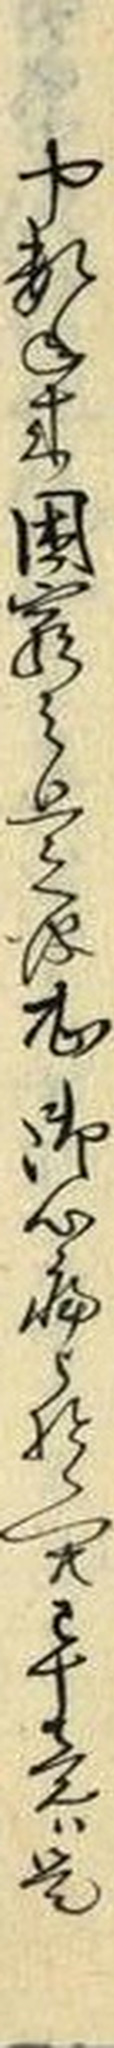中数年来困窮之上之儀甚御心痛被遊候へ共畢竟ハ是
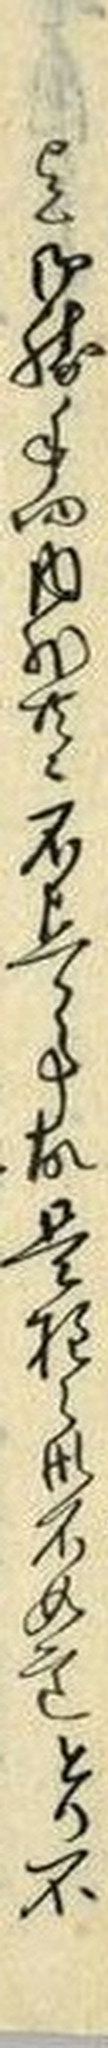迄御勝手向内外共ニ不申上候事故是程之御不如意とハ不
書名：少傅日録抄（斉承付側向頭取日記、在府）
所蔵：福井県文書館 Fukui Prefectural Archives
